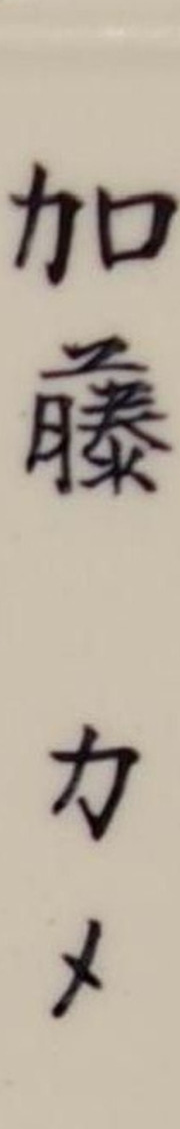加藤カメ
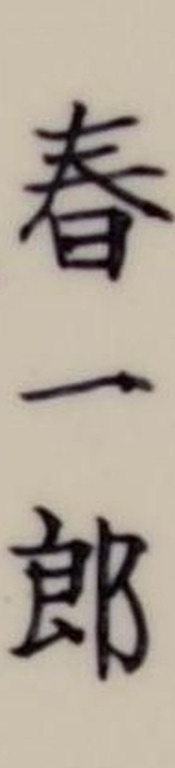春一郎
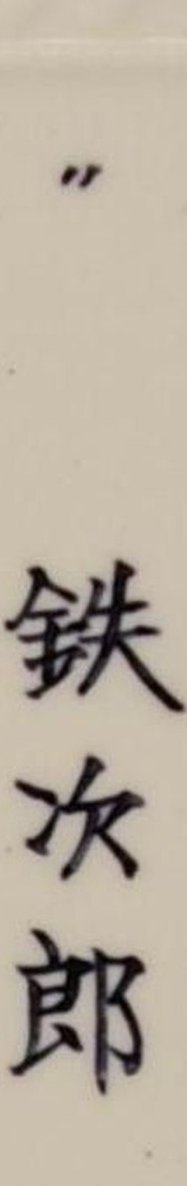鉄次郎
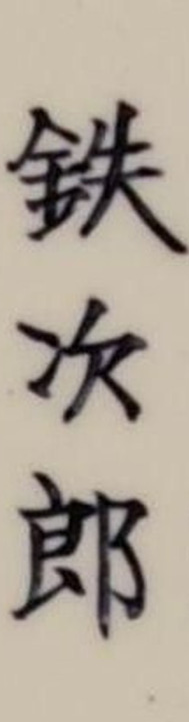鉄次郎
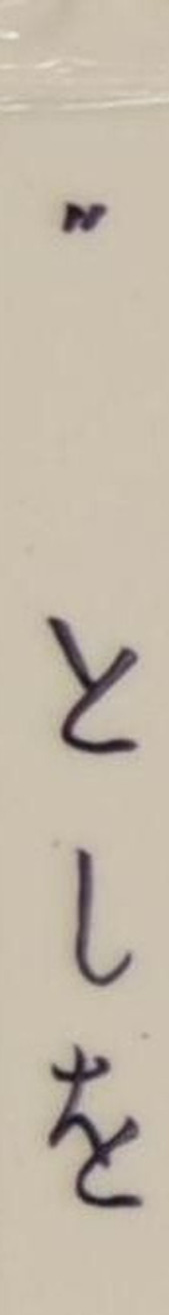としを
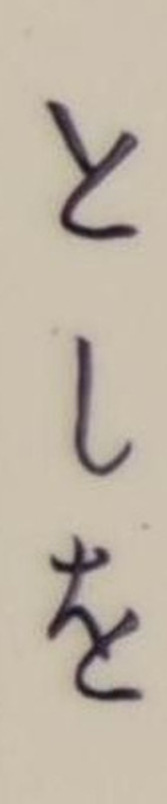としを

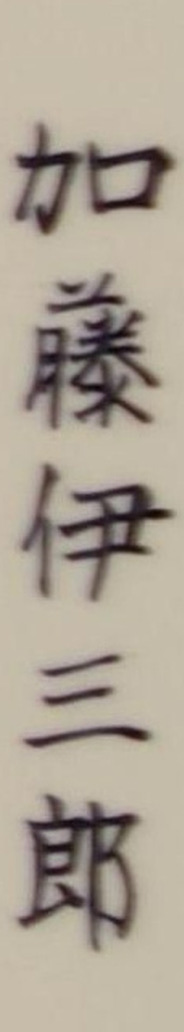加藤伊三郎
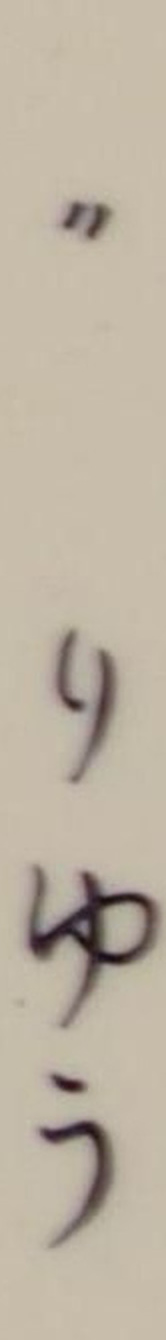りゆう
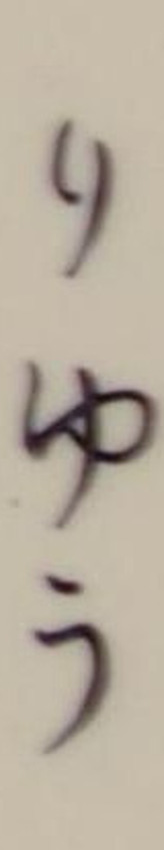りゆう
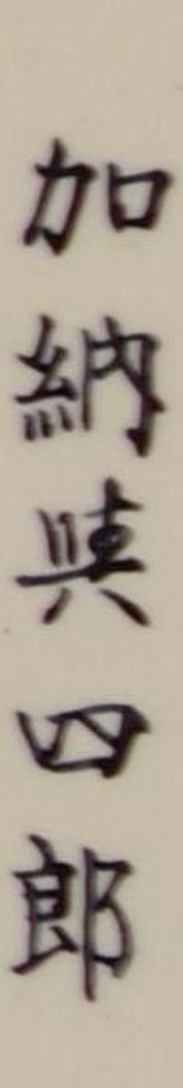加納与四郎
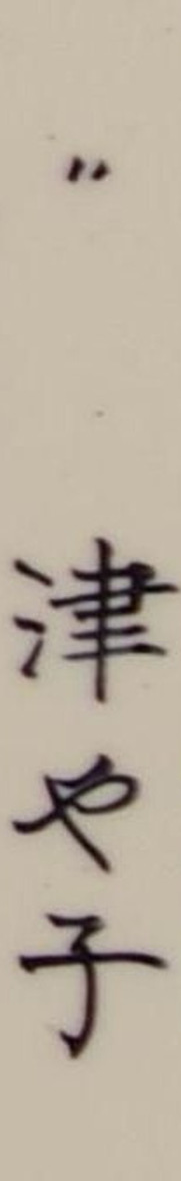つや子
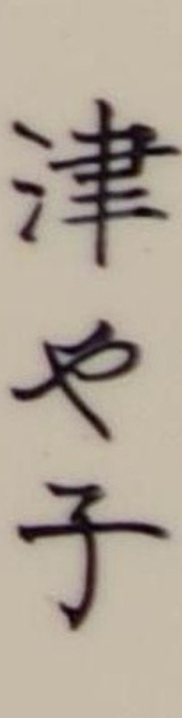つや子
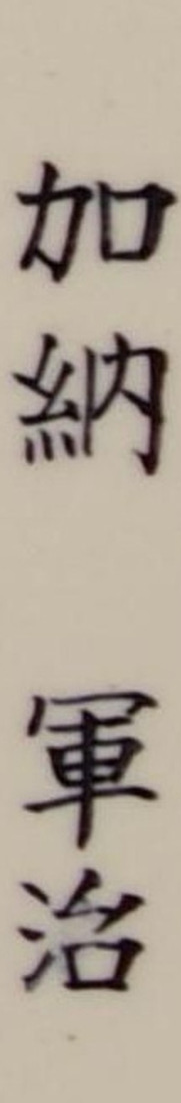加納軍治
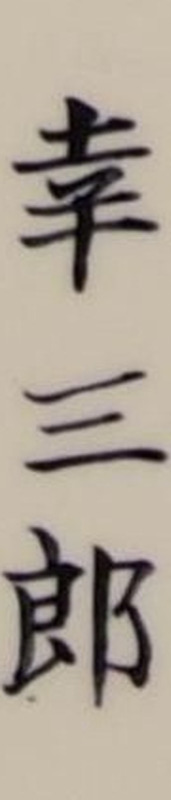幸三郎
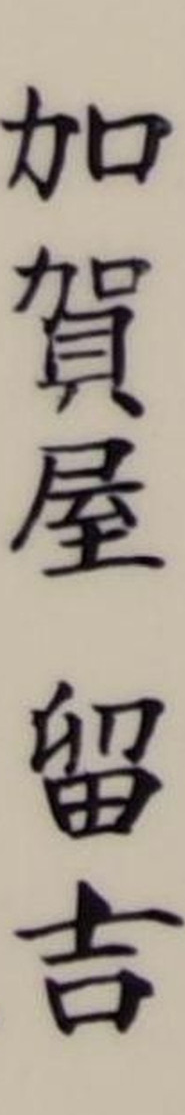加賀屋留吉
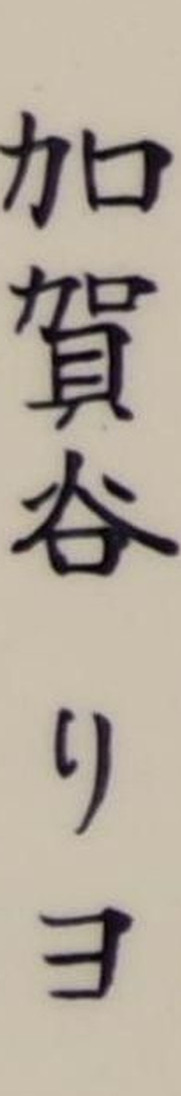加賀谷リヨ
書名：M~S
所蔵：高野山金剛峯寺
